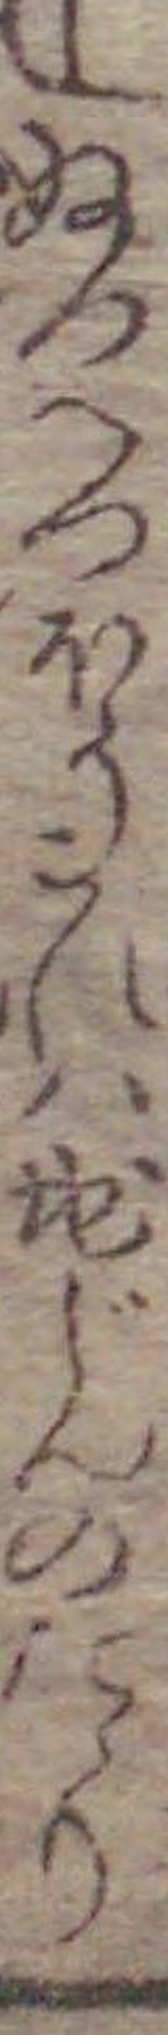ぬつへつほうこれは地じんのたゝり
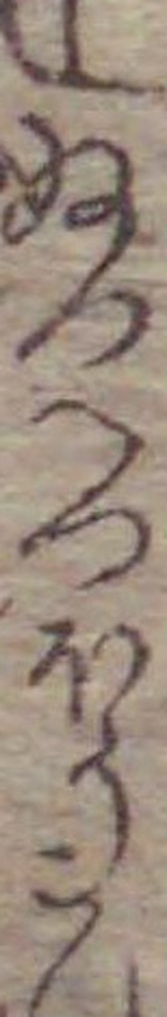上ぬつへつほう
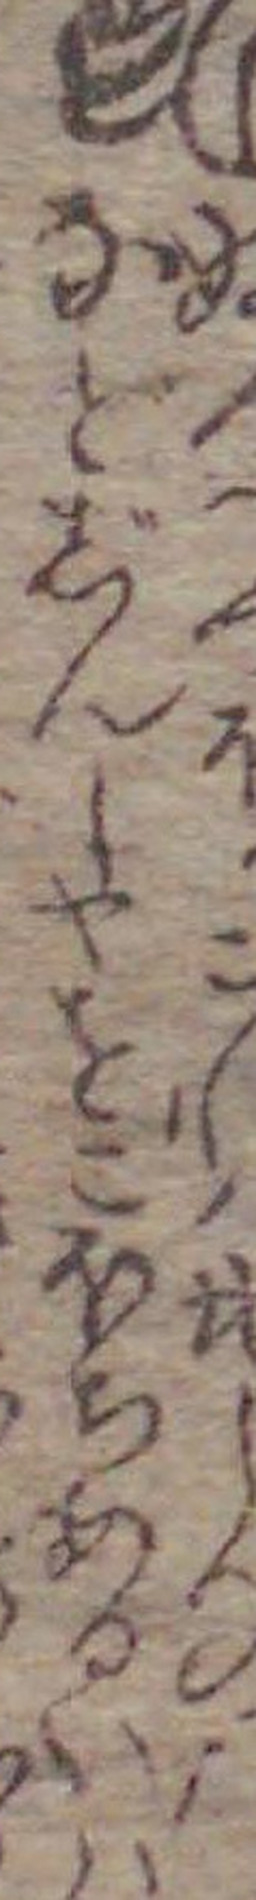なとじんしやをこほちあるいは

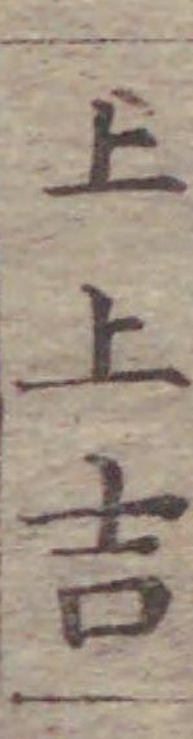上上吉
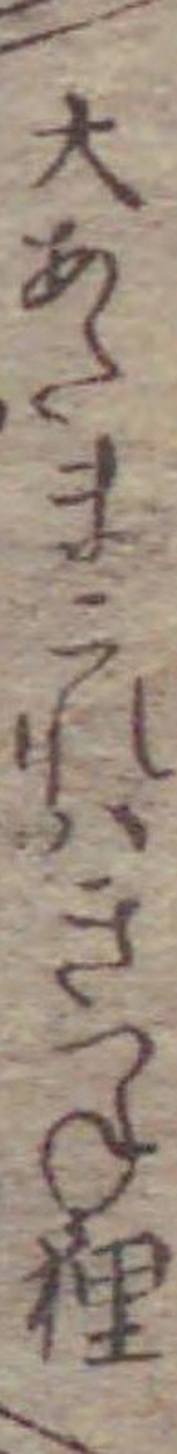大あたまこれはきつね狸
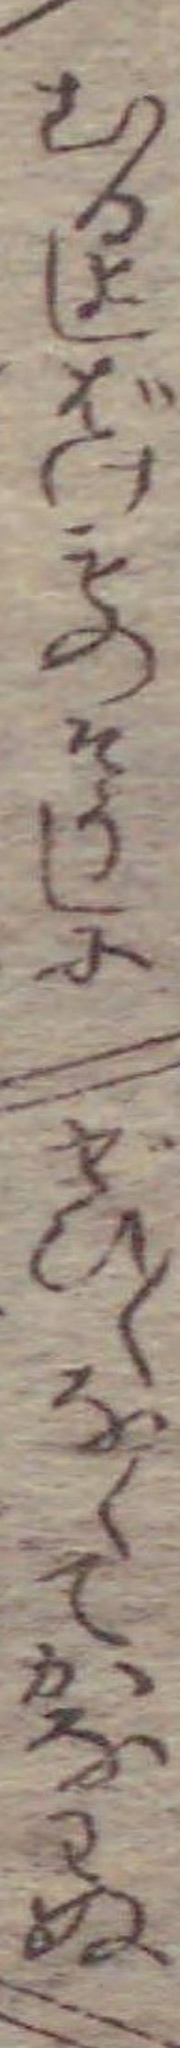むるよしばけものそうしにぜひ〳〵なくてかなわぬ
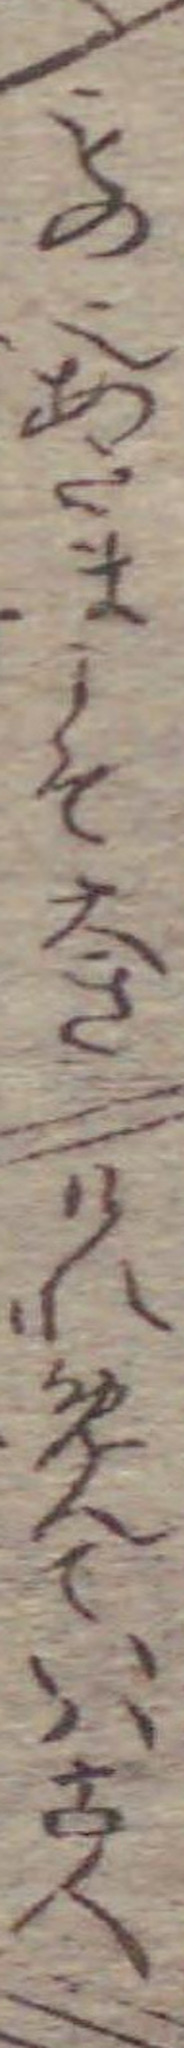もの也あたまこそ大きけれめんていは古人
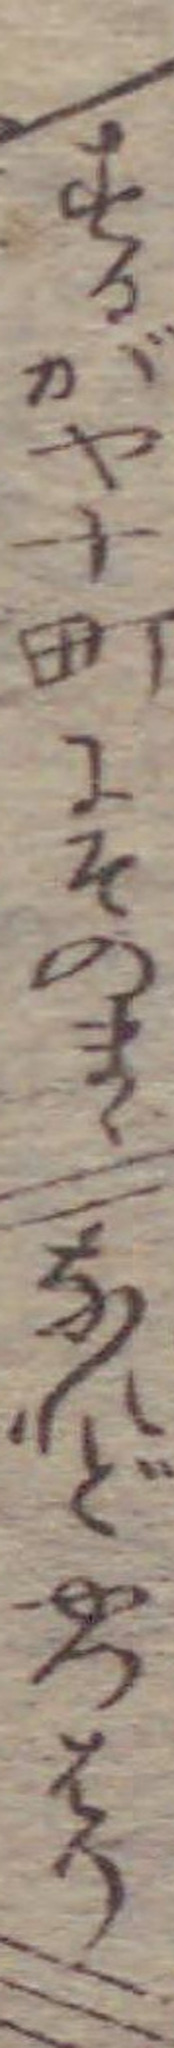するがや十町にそのまゝなれどやつはり
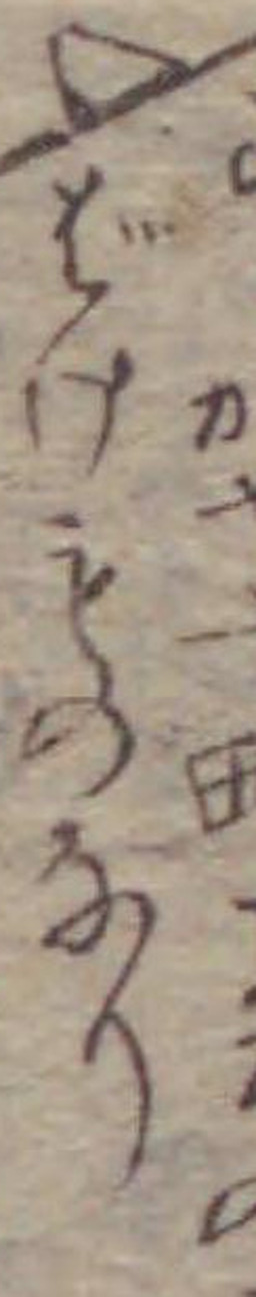ばけものなり
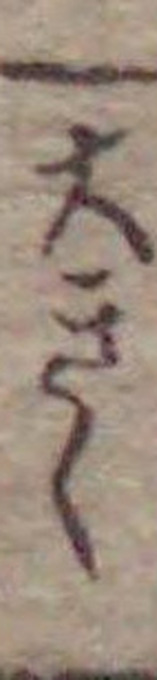大きく
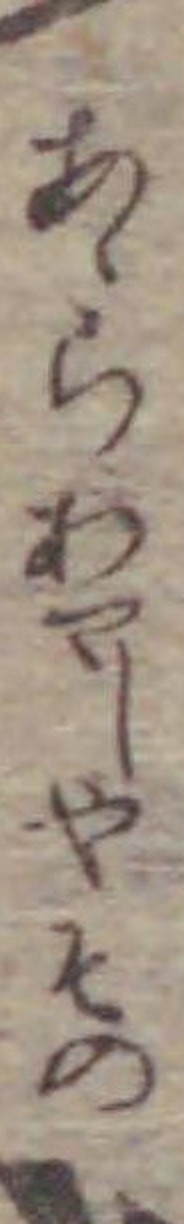あたらあやしやその
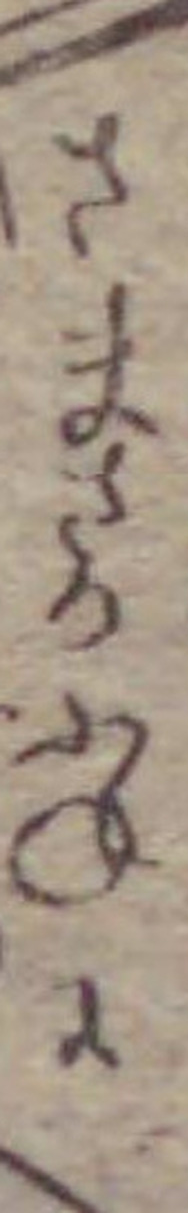さまさかふねに
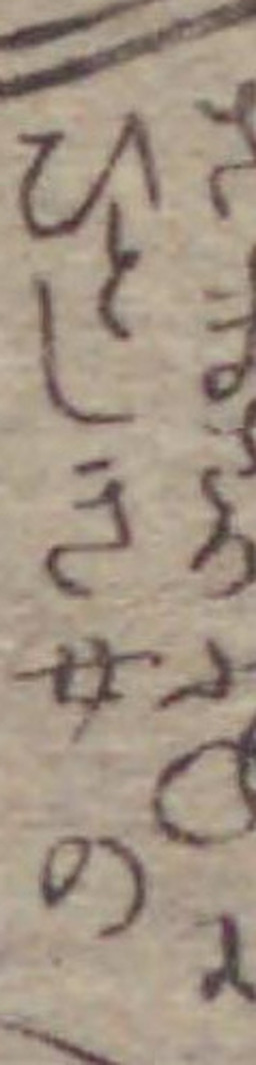ひとしき女の
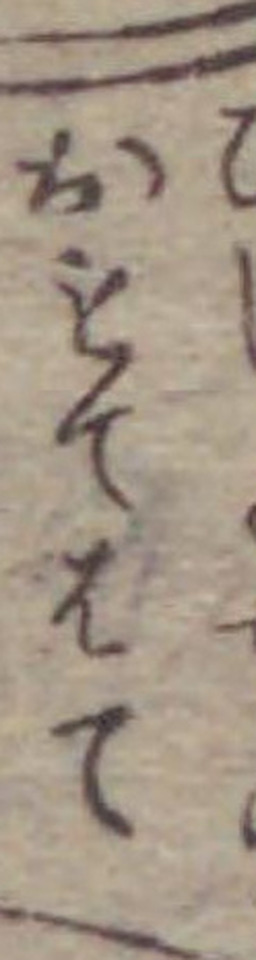おもてはて
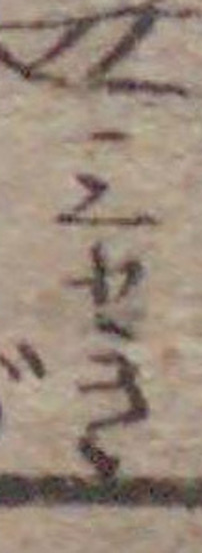三せき
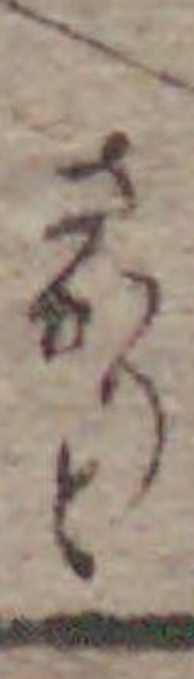さかりと
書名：妖怪仕内評判記 : 2巻
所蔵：国立国会図書館 National Diet Library, JAPAN
